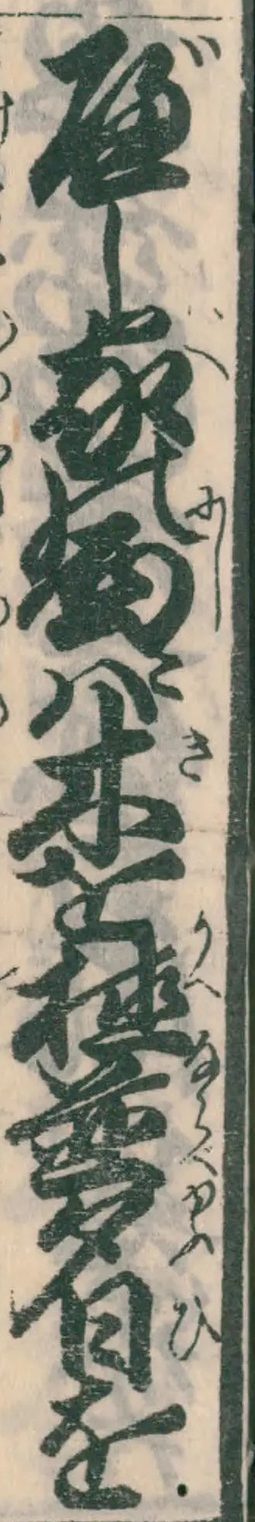べし家の西には木を植並夕日を
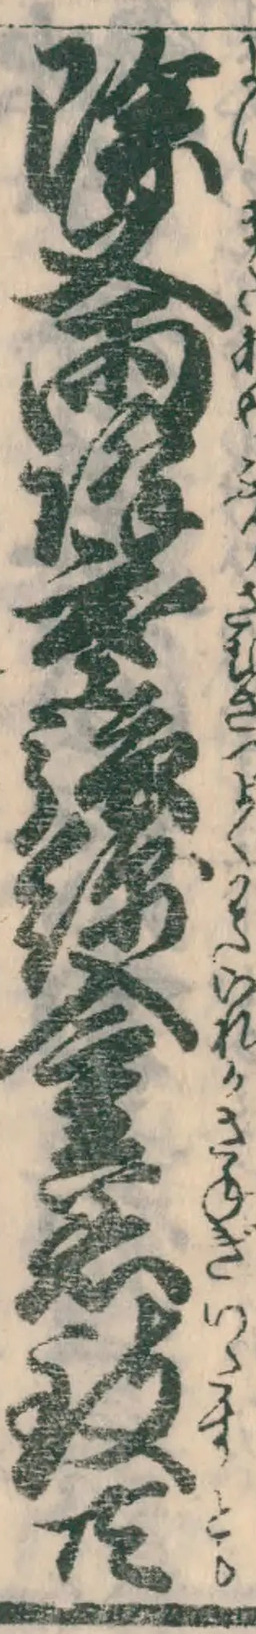除又雨降寒強綿入重着致共
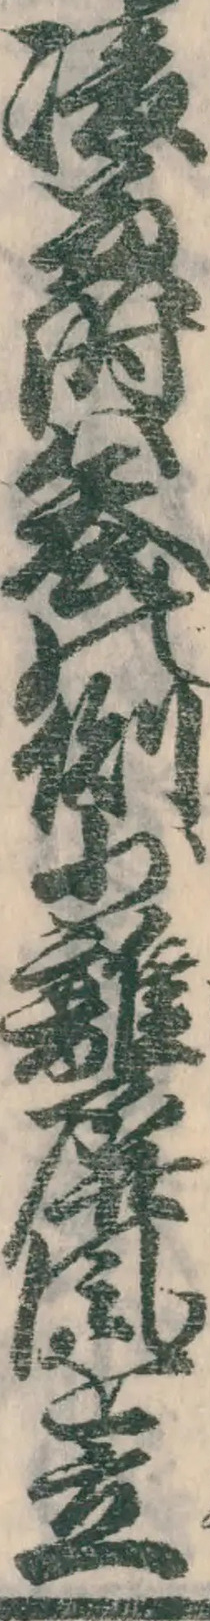凌兼時は蚕の側少離屏風を立
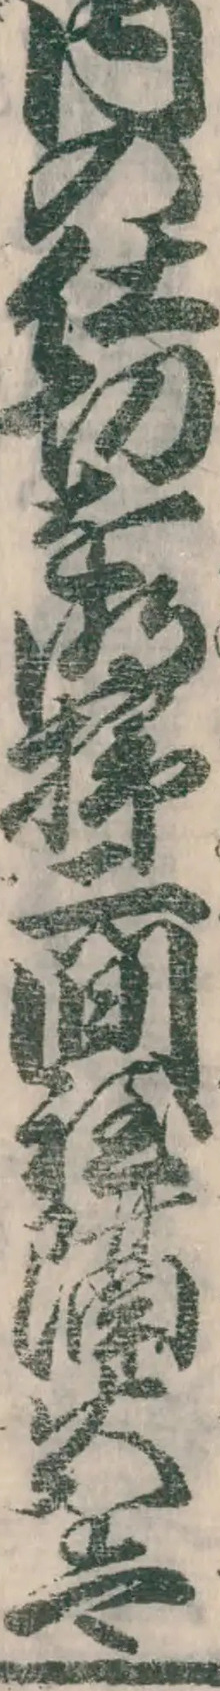内の仕切を明払二間程隔火を可
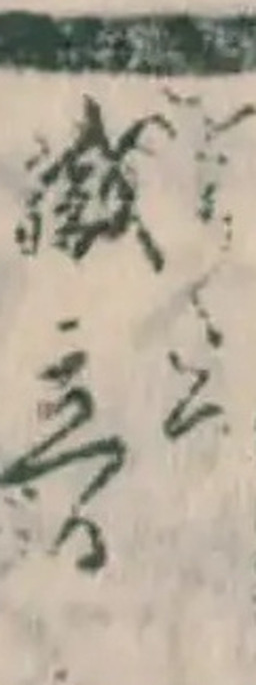織立る
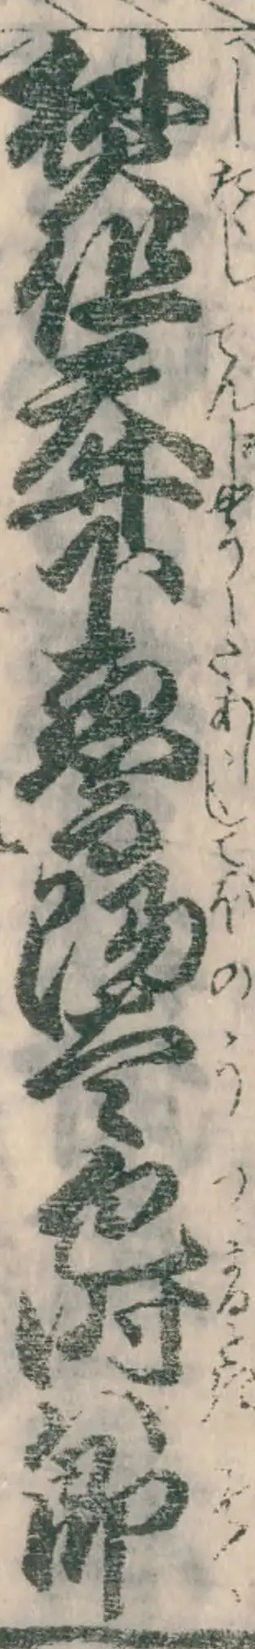焚但天井下悪て陽炎包時は即

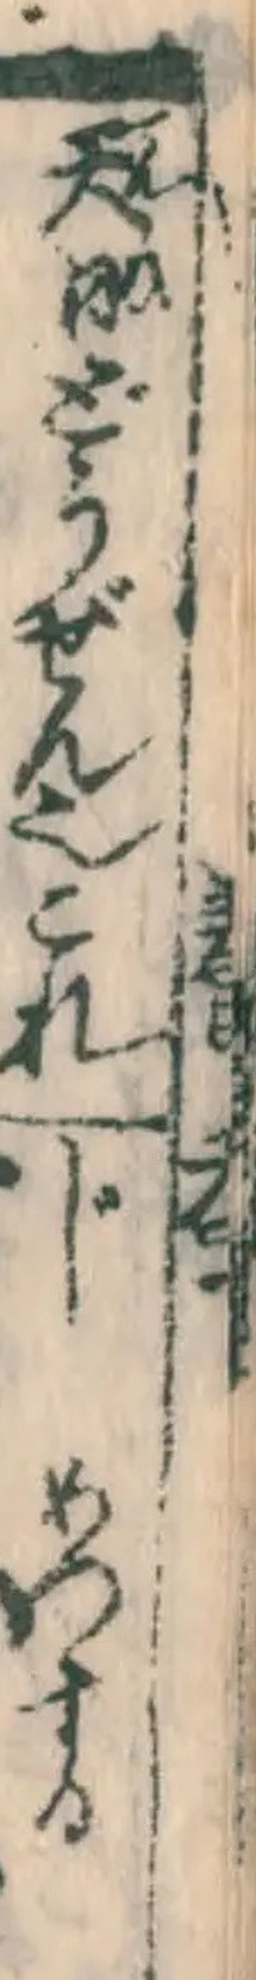天日どうぜんなりこれ
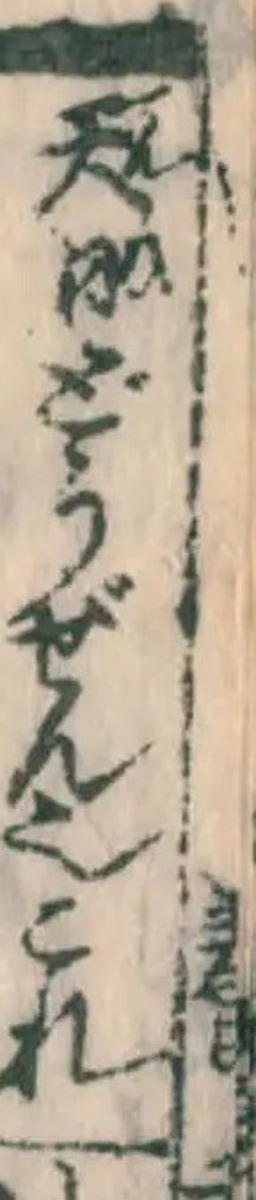天日どうぜんなりこれ
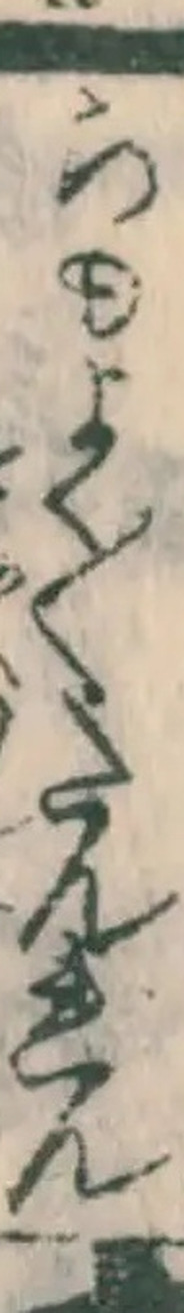らもよく〳〵たんれん
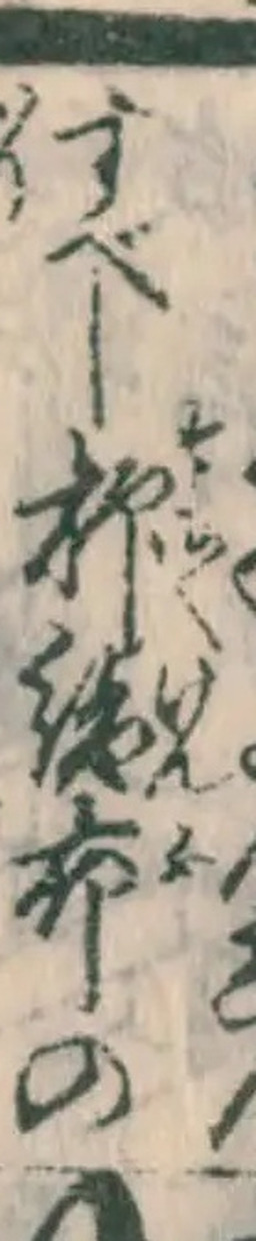すべし抑絹布の
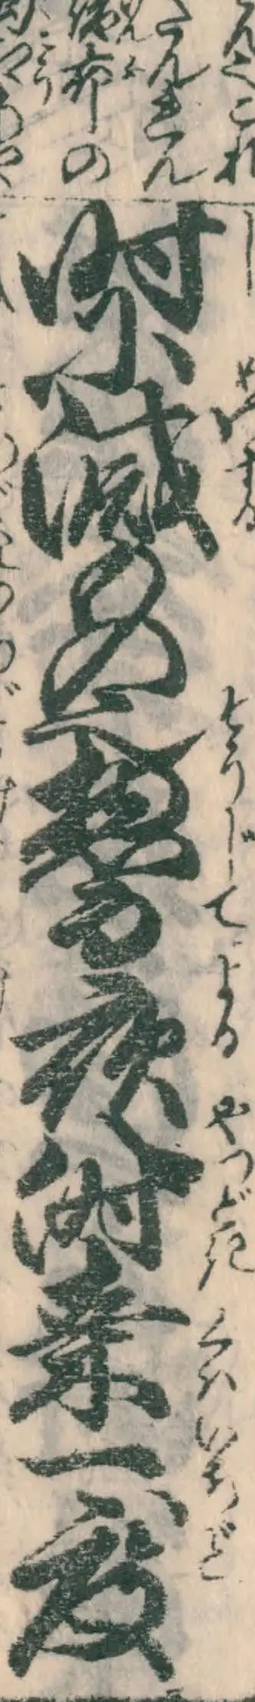時に滅もの也惣而夜八時桑一度
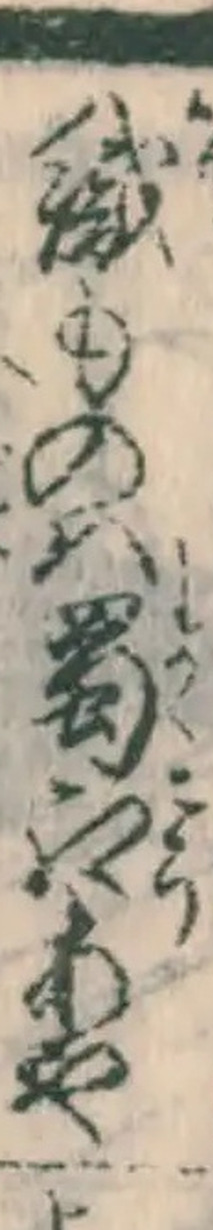織ものは蜀紅あや
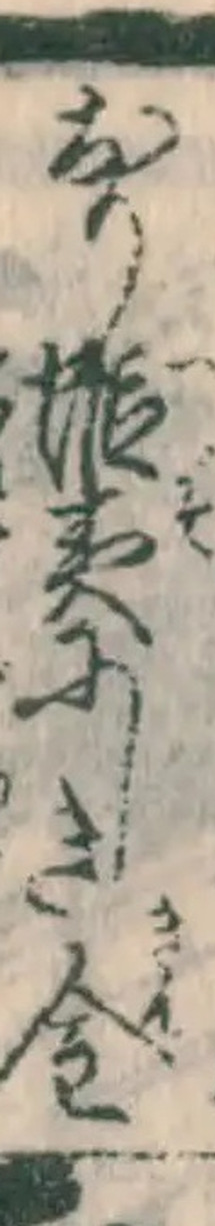おり蝦夷にしき金
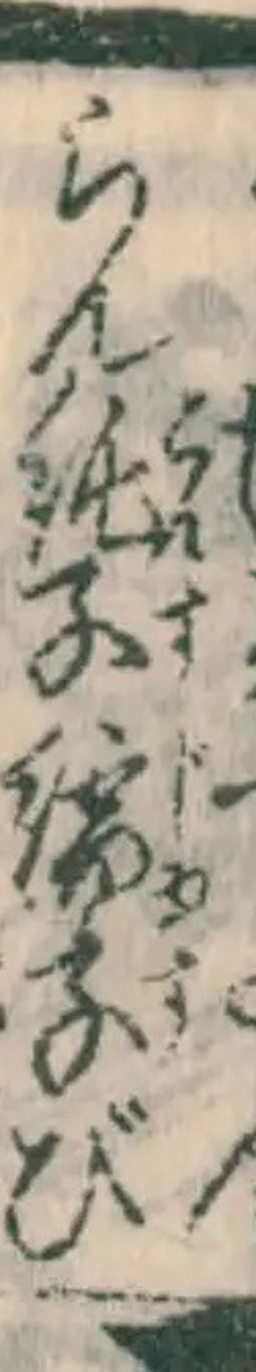らん純子繻子び
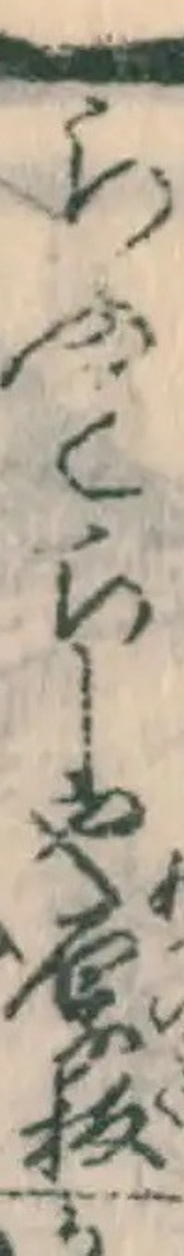らふとらしや厚板
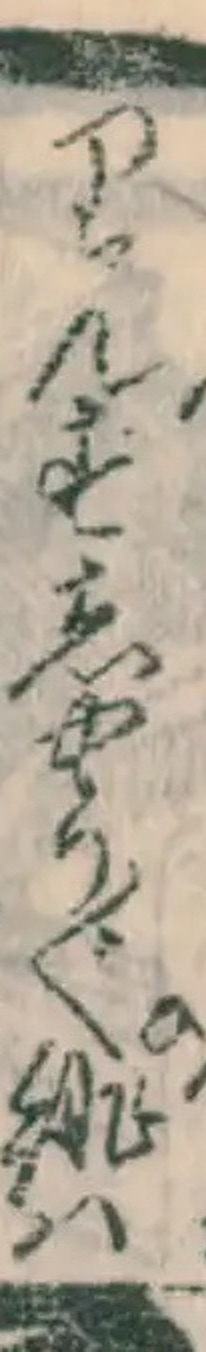りんずしやう〴〵緋は
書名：養蚕往来
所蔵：国立国会図書館 National Diet Library, JAPAN
